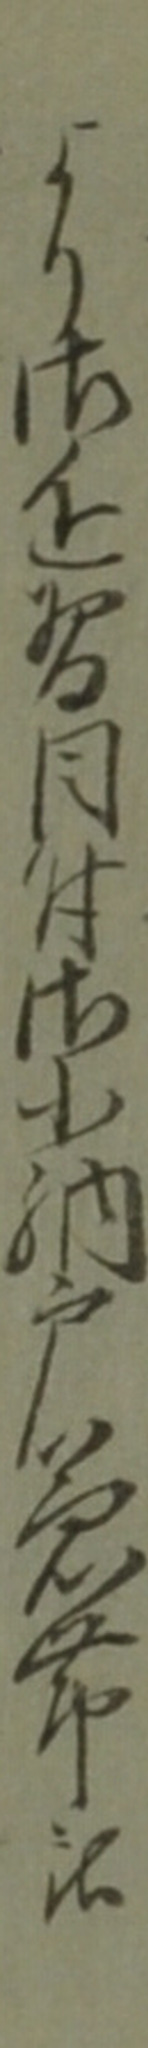より御近習目付御小納戸兼帯被
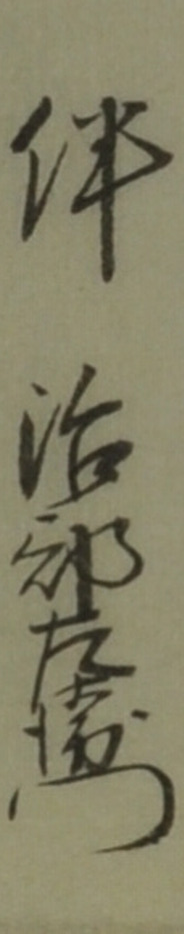伴治部左衛門
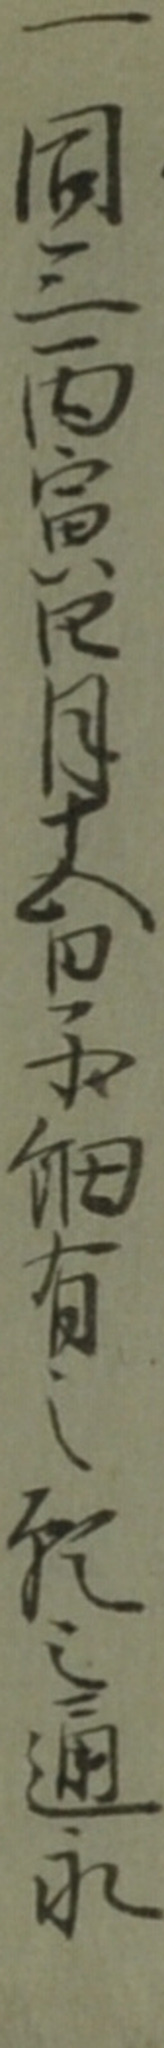一同三丙寅正月四月十五日子細有之願之通永
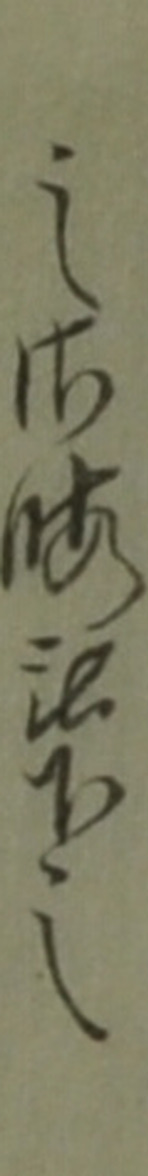之御暇被下之
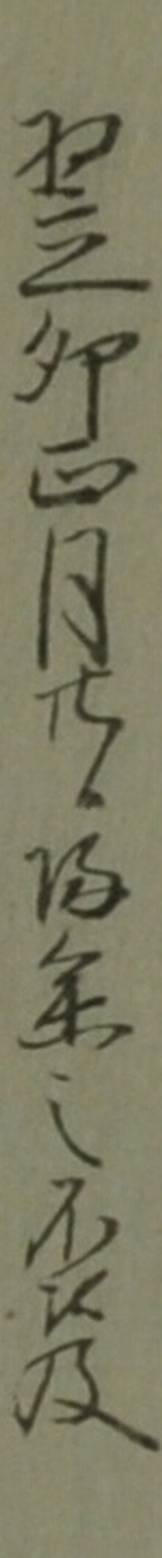翌卯正月廿日帰参之不被及
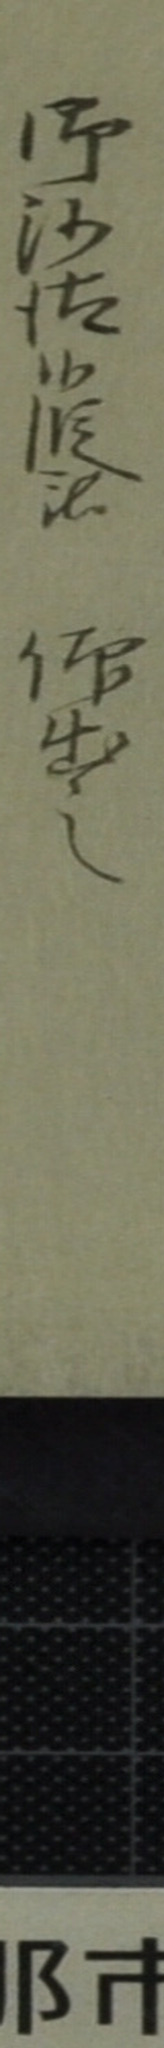御沙汰御段被仰出之
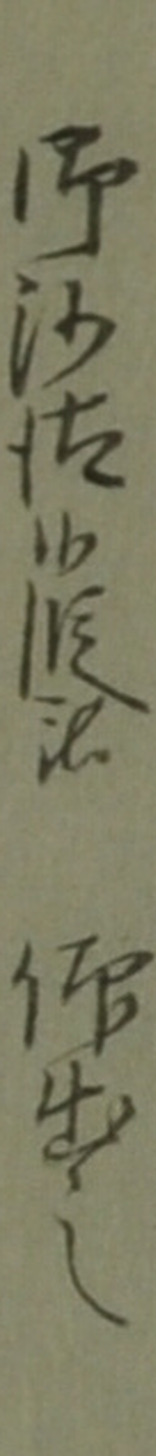御沙汰御段被仰出之
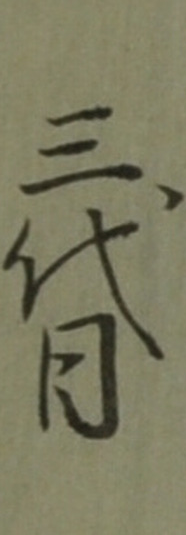三代目
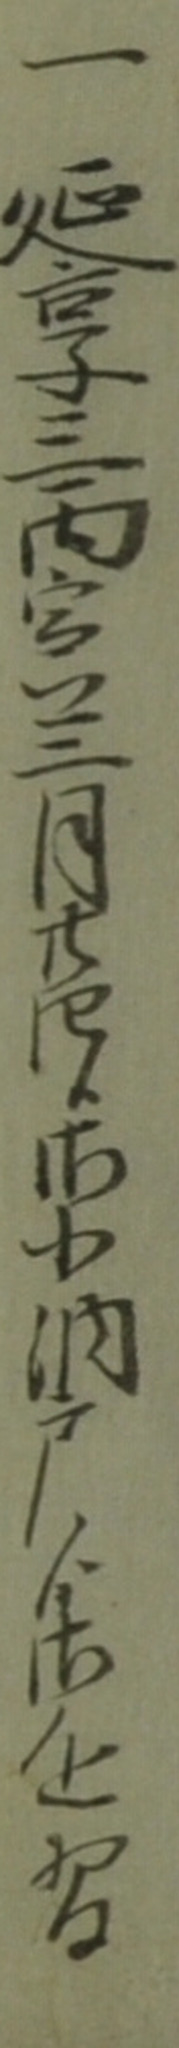一延享三丙寅三月廿四日御小納戸ゟ御近習
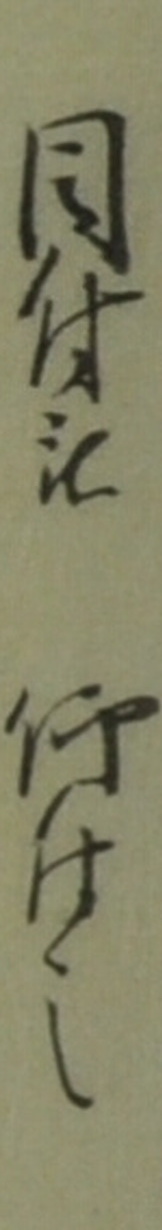目付被仰付之
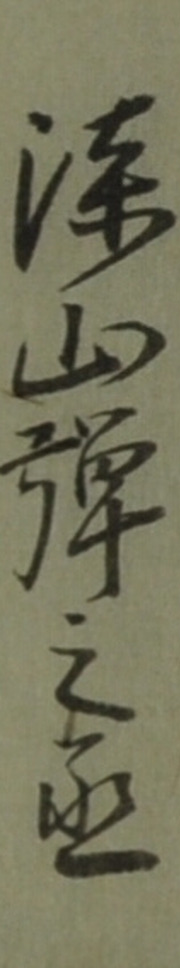漆山弾之丞

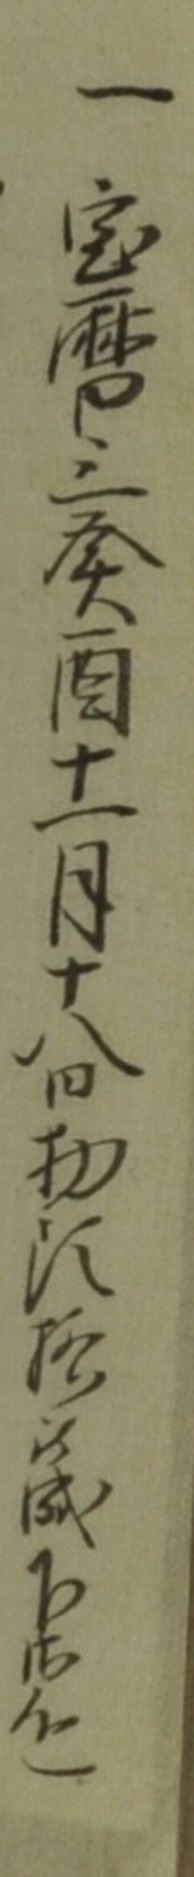一宝暦三癸酉十一月十八日物頭格被成下御近
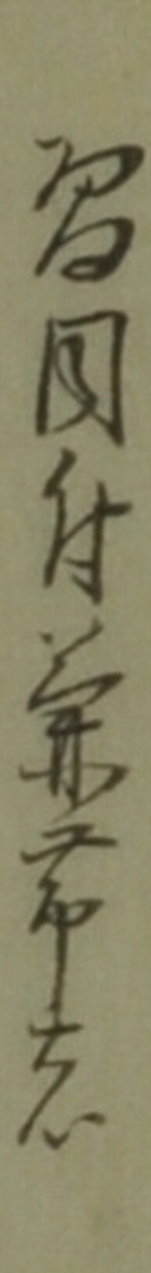習目付兼帯者
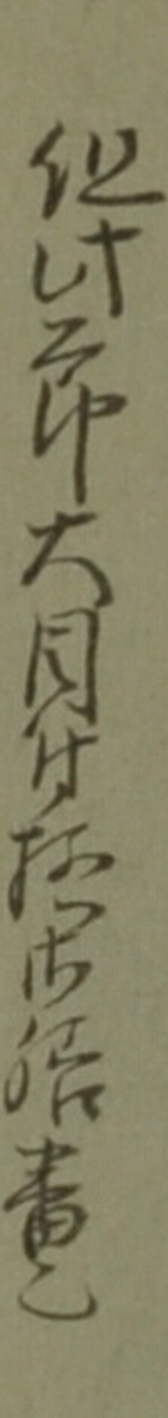但此節大目付格御御膳番也
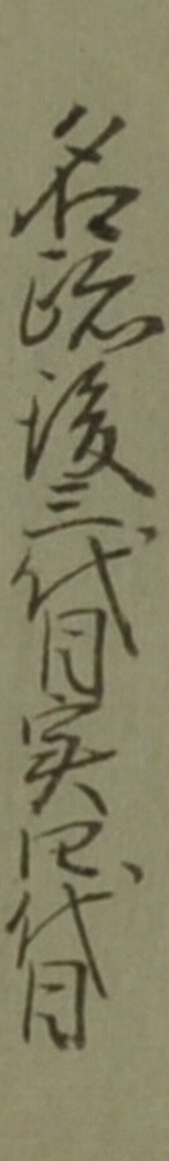名跡後三代目実四代目
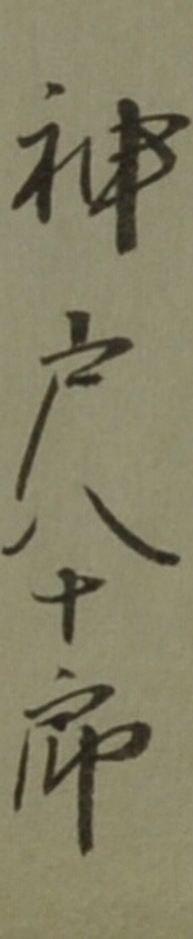神戸八十郎
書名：諸御役代々録（四）
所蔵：伊那市立高遠町図書館・合同会社AMANE
